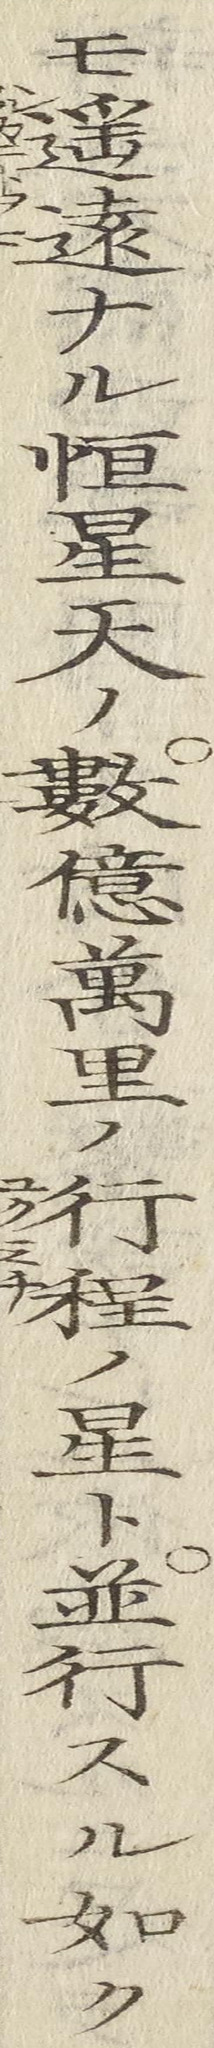モ遥遠ナル恒星天ノ。数億万里ノ行程ノ星ト。並行スル如ク
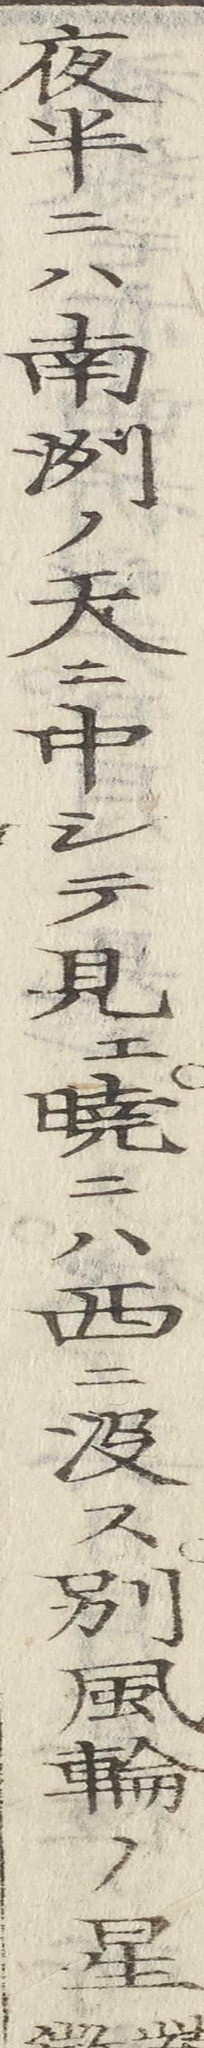夜半ニハ南洲ノ天ニ中シテ見エ。暁ニハ西ニ没ス。別風輪ノ星紫微
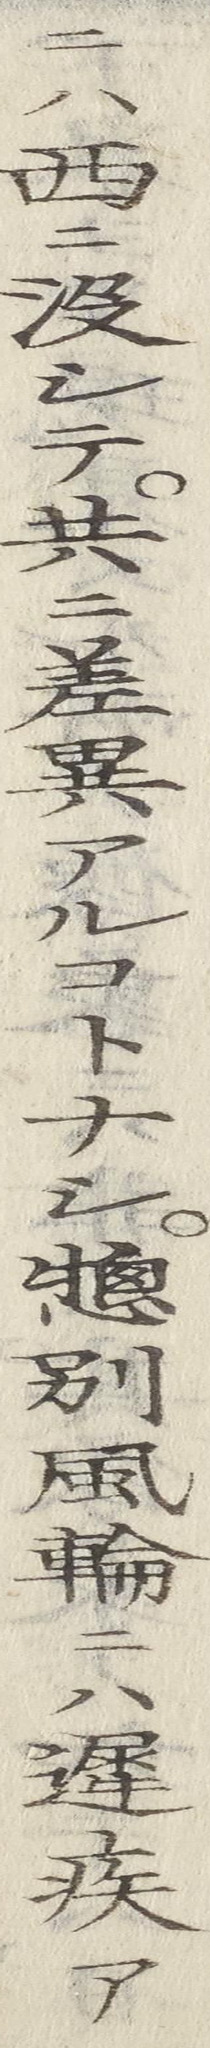ニハ西ニ没シテ。共ニ差異アルコトナシ。惣風輪ニハ遅疾ア
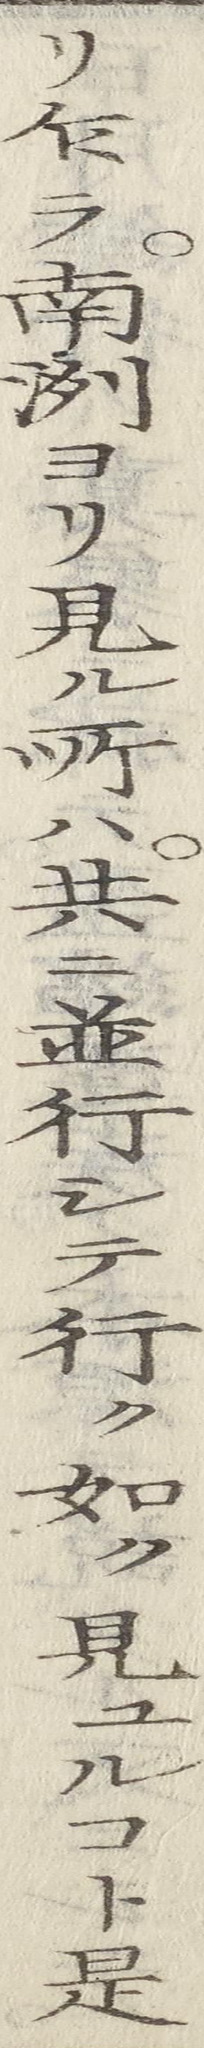リ乍ラ。南洲ヨリ見ル所ハ。共ニ並行シテ行ク如ク見ユルコト是
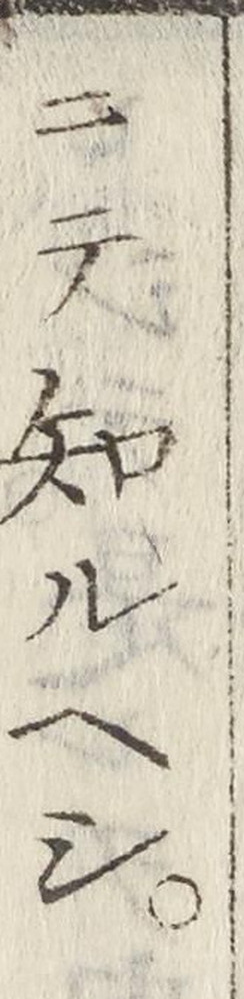ニテ知ルヘシ。
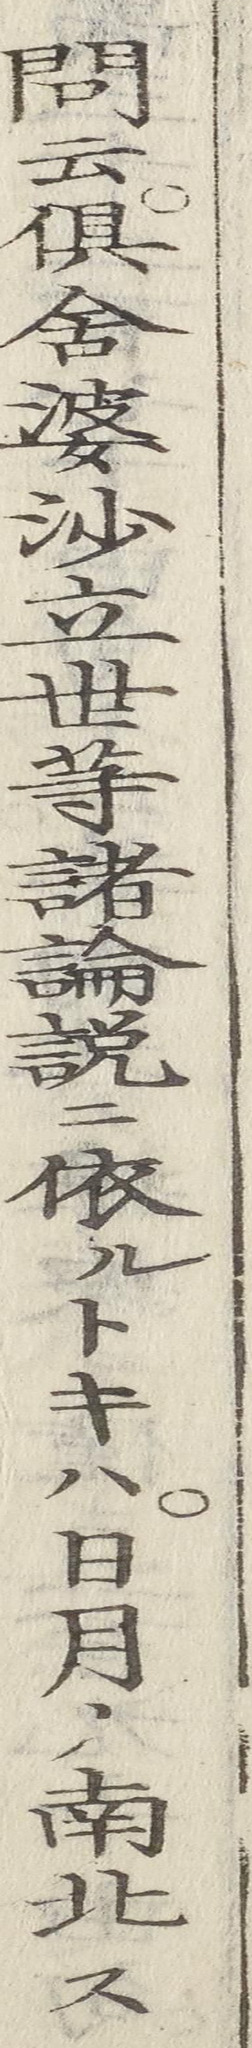問云。俱舎婆沙立世等諸論説ニ依ルトキハ。日月ノ南北ス
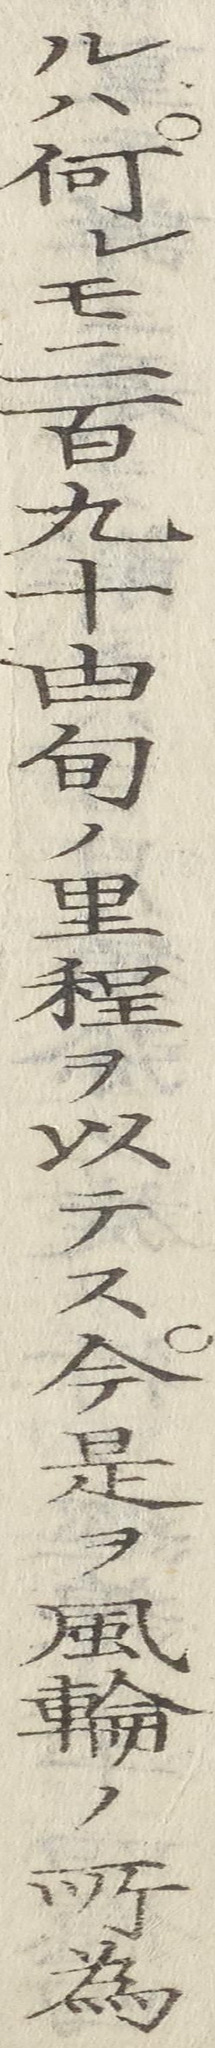ルハ。何レモ二百九十由旬ノ里程ヲ以テス。今是ヲ風輪ノ所為
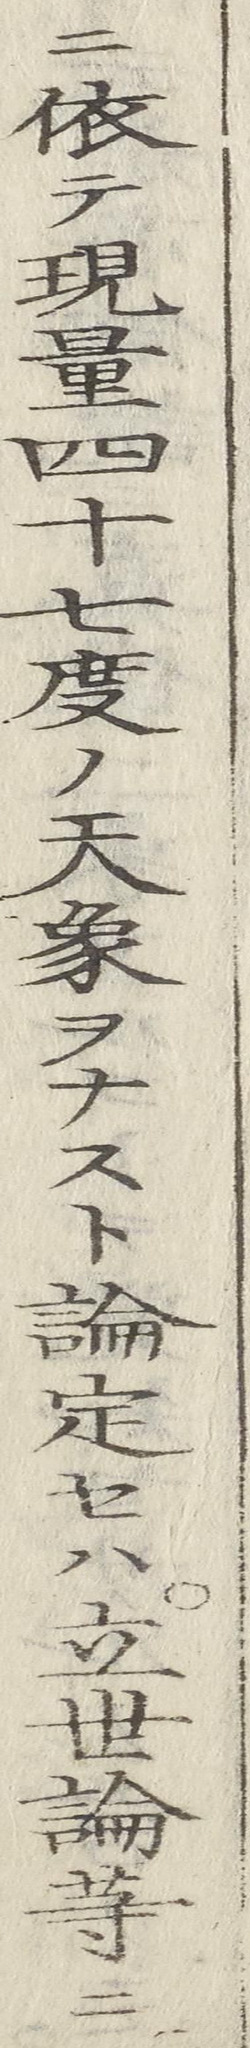ニ依テ現量四十七度ノ天象ヲナスト論定セハ。立世論等ニ。

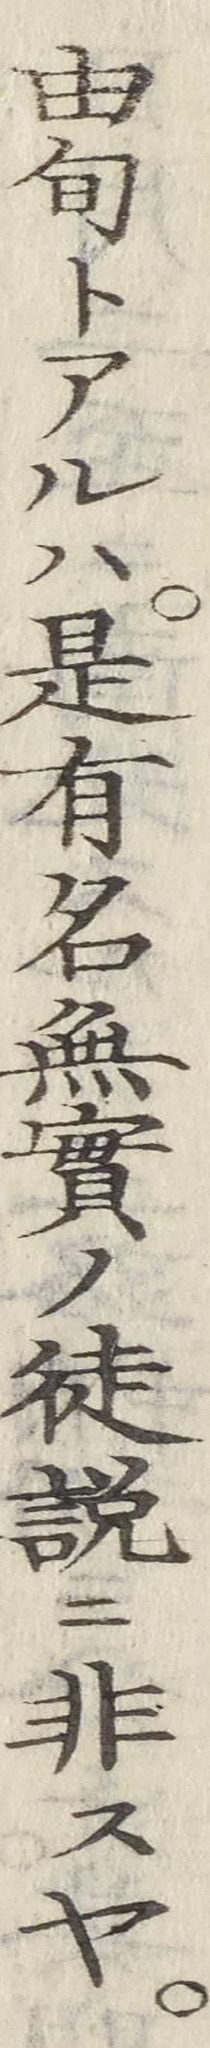由旬トアルハ。是有名無実ノ徒説ニ非スヤ。
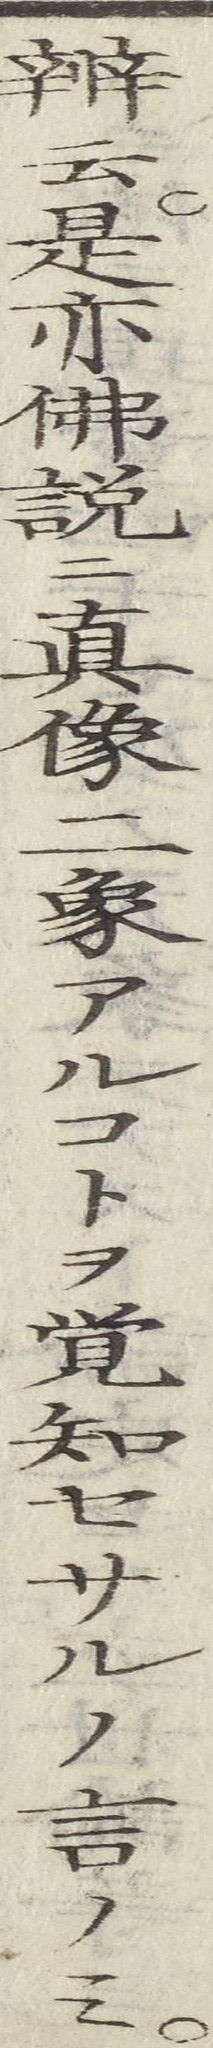弁云。是亦仏説ニ真像ニ象アルコトヲ覚知セサルノ言ノミ。
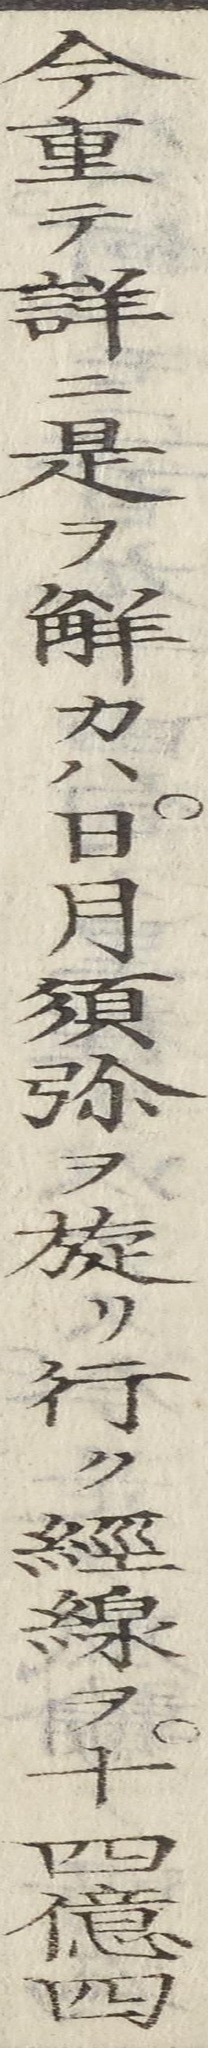今重テ詳ニ是ヲ解カハ。日月須弥ヲ旋リ行ク経線ヲ。十四億四
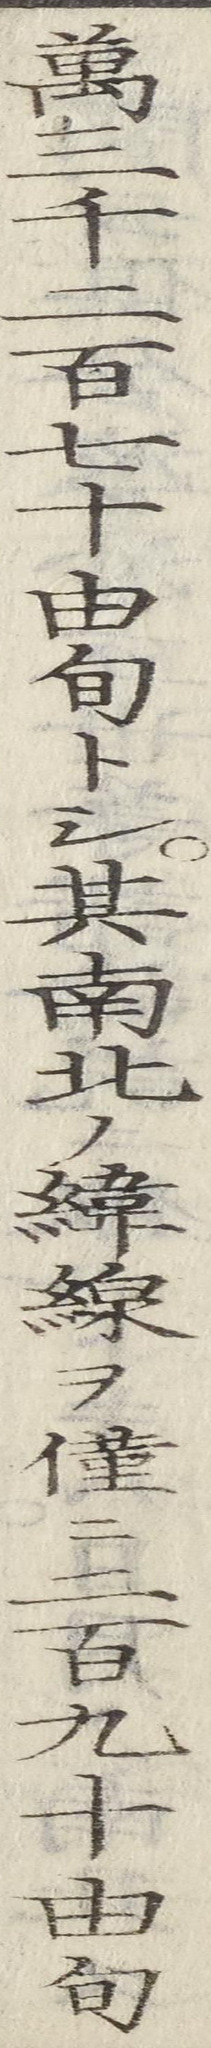万三千二百七十由旬トシ。其南北ノ緯線ヲ僅ニ二百九十由旬
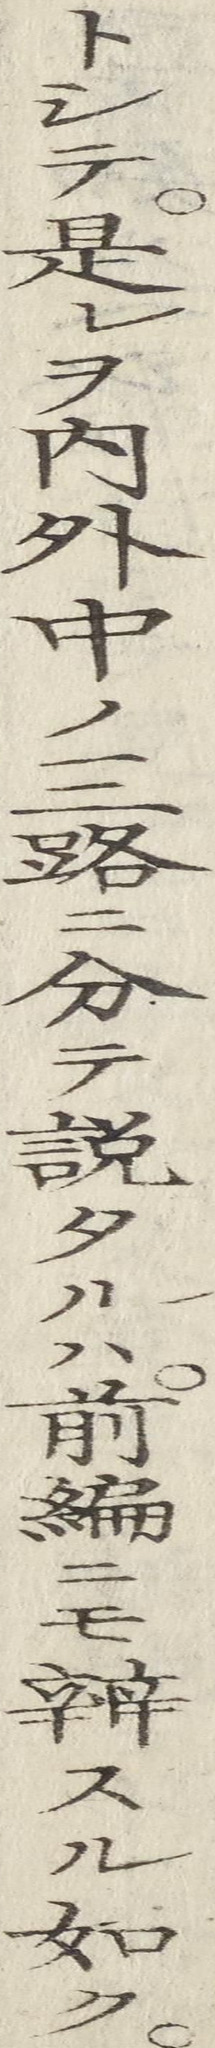トシテ。是レヲ内外中ノ三路ニ分テ説タルハ。前編ニモ弁スル如ク。
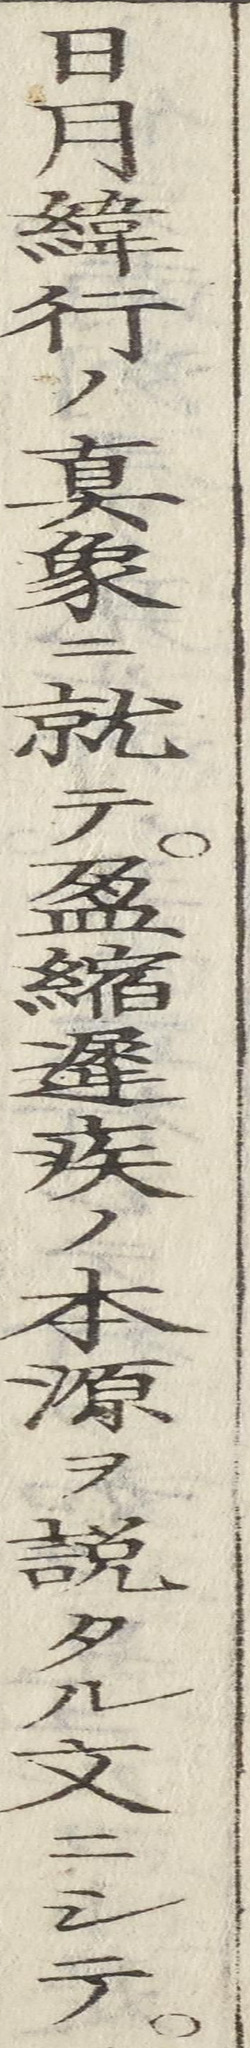日月緯行ノ真象ニ就テ。盈縮遅疾ノ本源ヲ説タル文ニシテ。
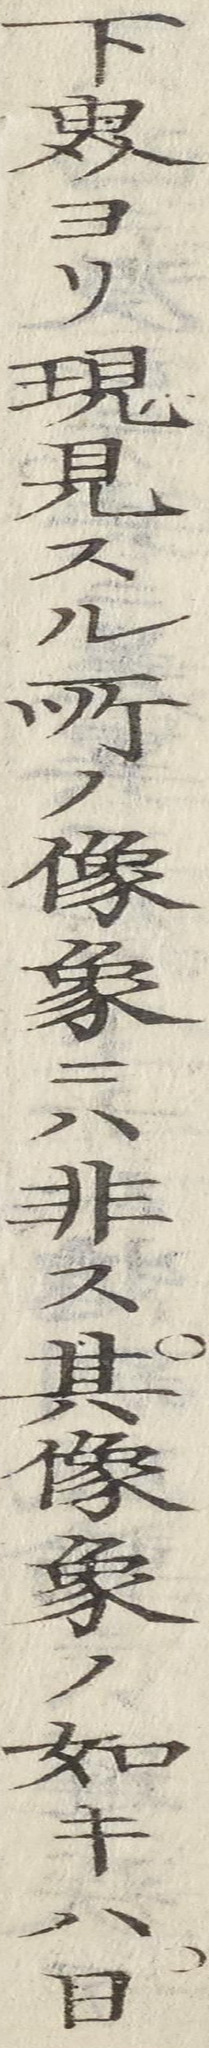下界ヨリ現見スル所ノ像象ニハ非ス。其像象ノ如キハ。日
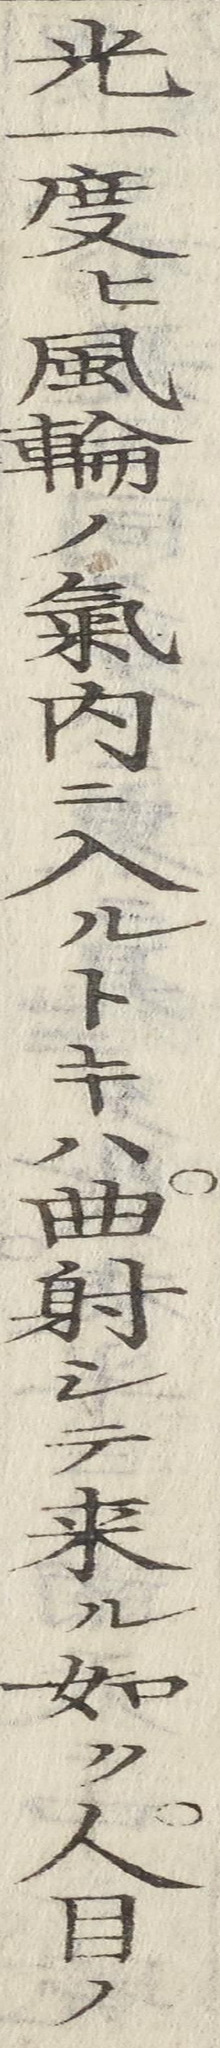光一度ヒ風輪ノ気内ニ入ルトキハ。曲射シテ来ル如ク。人目ノ
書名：護法新論　二編　上
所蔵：東京大学地震研究所図書室 Earthquake Research Institute Library, The University of Tokyo, JAPAN
